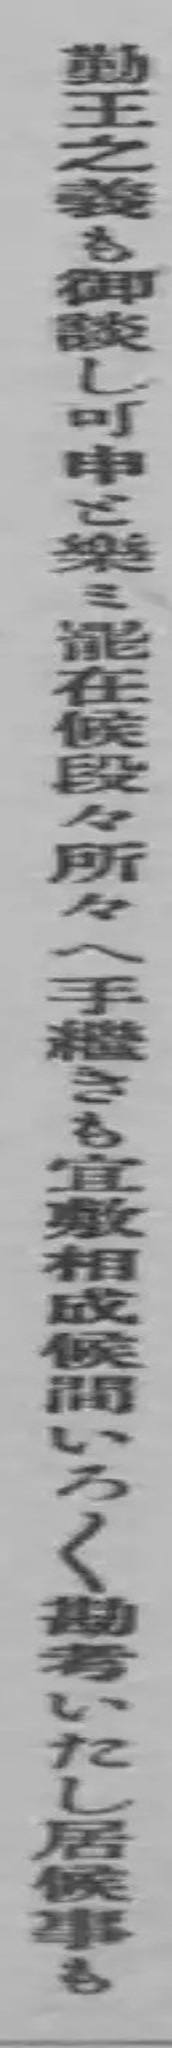勤王之義も御談し可申と楽ミ罷在候段々所々へ手継きも宜敷相成候間いろ〳〵勘考いたし居候事も
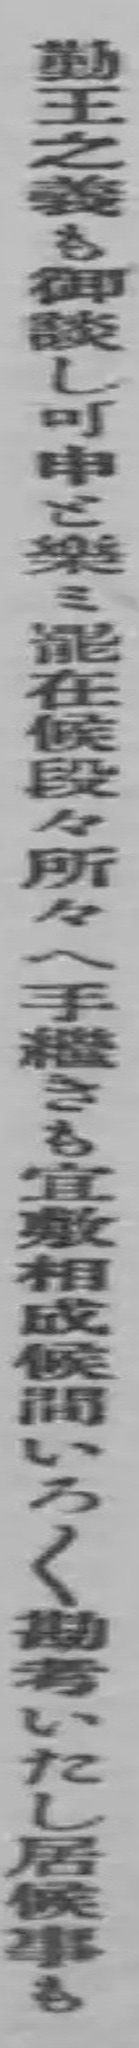勤王之義も御談し可申と楽ミ罷在候段々所々へ手継きも宜敷相成候間いろ〳〵勘考いたし居候事も
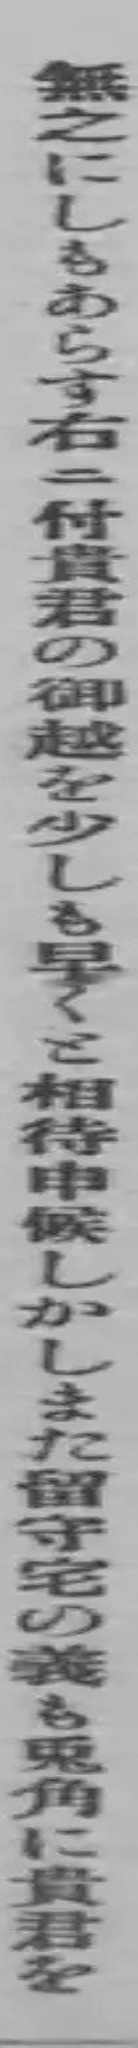無之にしもあらす右ニ付貴君の御越を少しも早くと相待申候しかしまた留守宅の義も兎角に貴君を
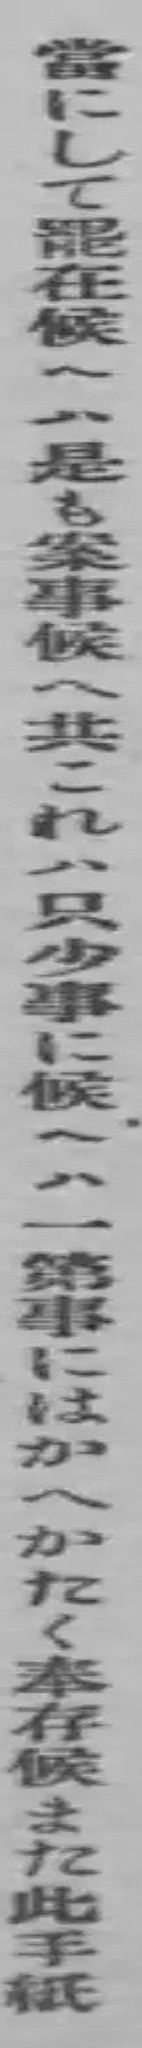当にして罷在候へハ是も案事候へ共これハ只少事に候へハ一第事にはかへかたく奉存候また此手紙
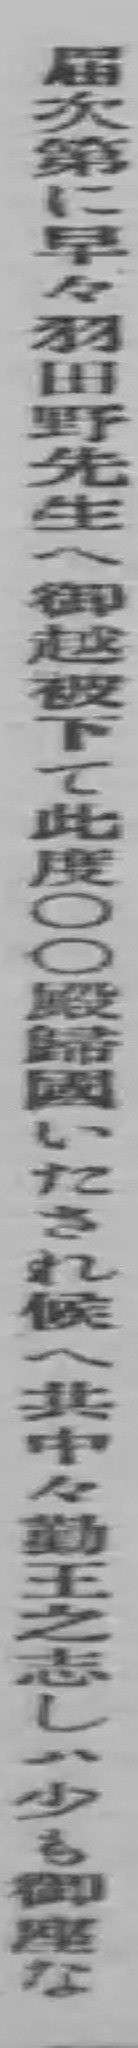届次第に早々羽田野先生へ御越被下て此度○○殿帰国いたされ候へ共中々勤王之志しハ少も御座な
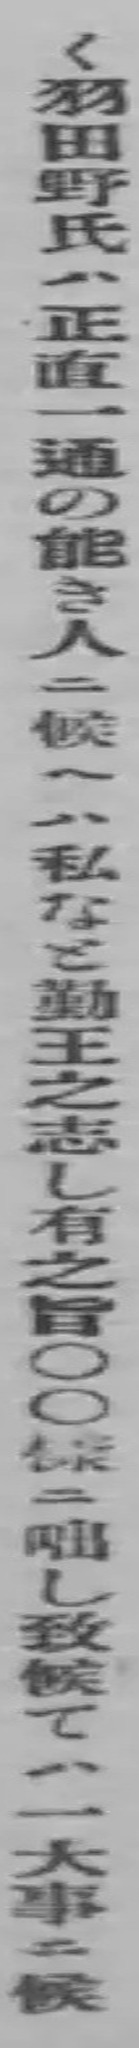く羽田野氏ハ正直一通の能き人ニ候へハ私なと勤王之志し有之旨○○様ニ咄し致候てハ一大事ニ候
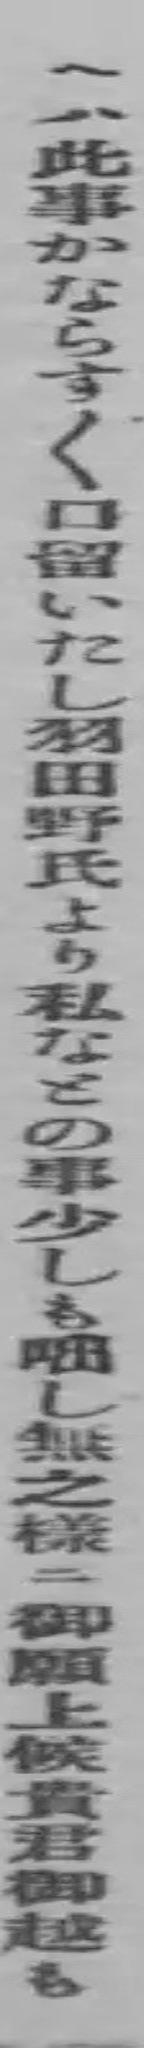へハ此事かならす〳〵口留いたし羽田野氏より私なとの事少しも咄し無之様ニ御願上候貴君御越も
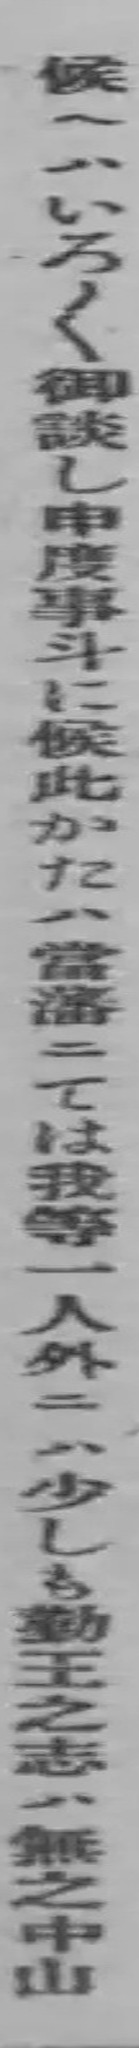候へハいろ〳〵御談し申度事斗に候此かたハ当藩ニては我等一人外ニハ少しも勤王之志ハ無之中山

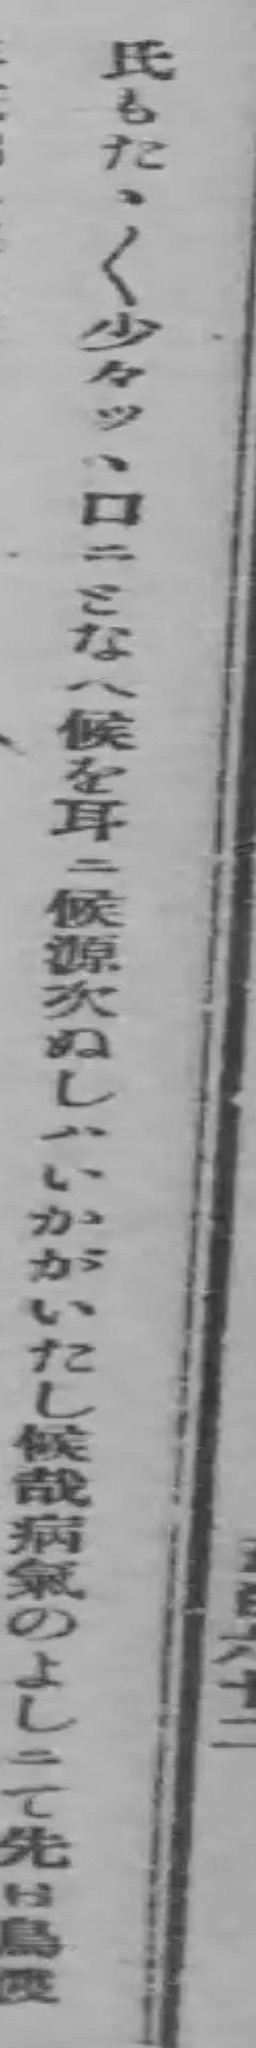氏もたゝ〳〵少々ツヽ口ニとなへ候を耳ニ候源次ぬしハいかがいたし候哉病気のよしニて先日鳥渡
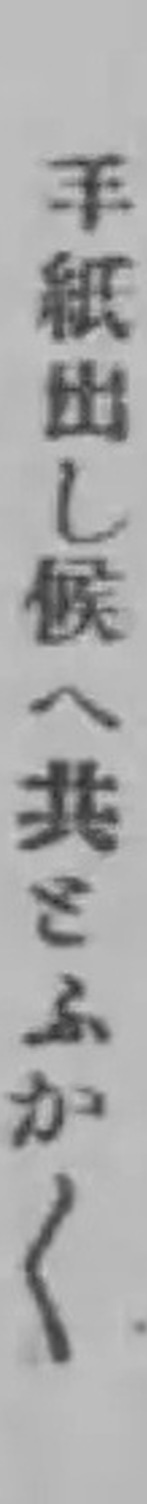手紙出し候へ共とふか〳〵
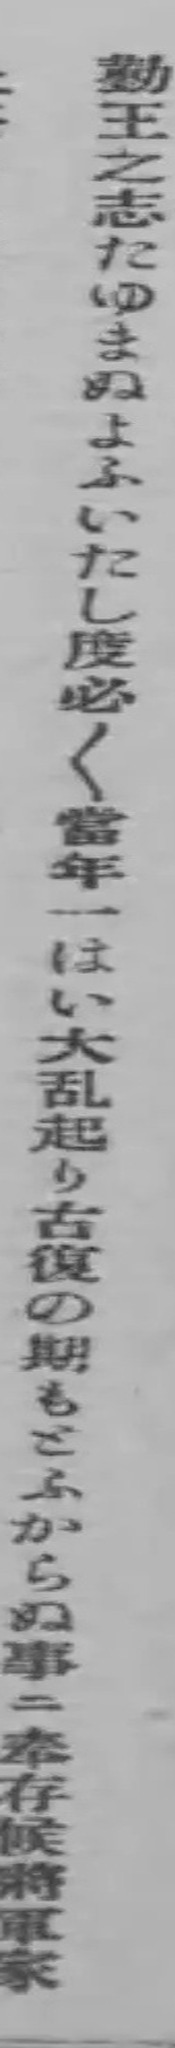勤王之志たゆまぬよふいたし度必〳〵当年一はい大乱起り古復の期もとふからぬ事ニ奉存候将軍家
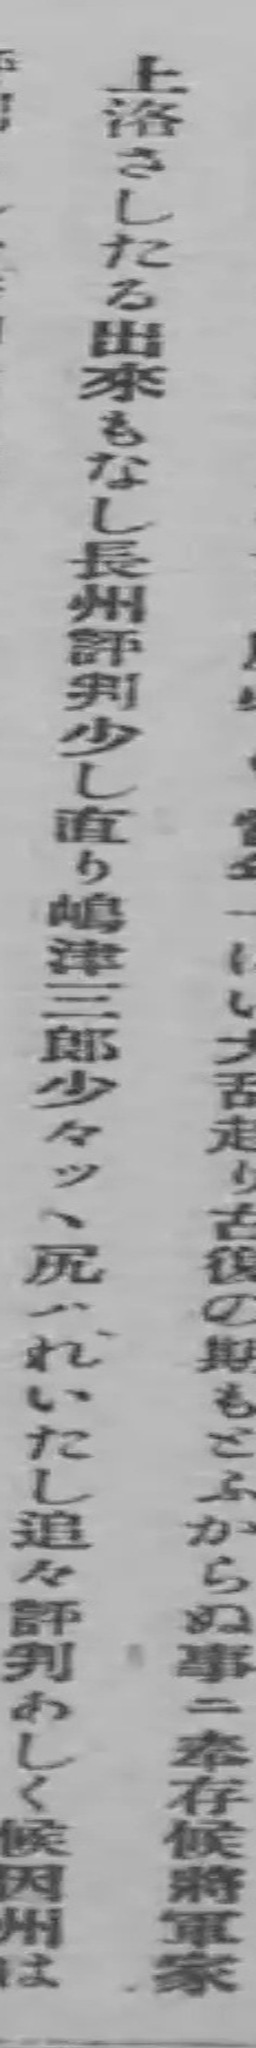上洛さしたる出来もなし長州評判少し直り嶋津三郎少々ツヽ尻ハれいたし追々評判あしく候因州は
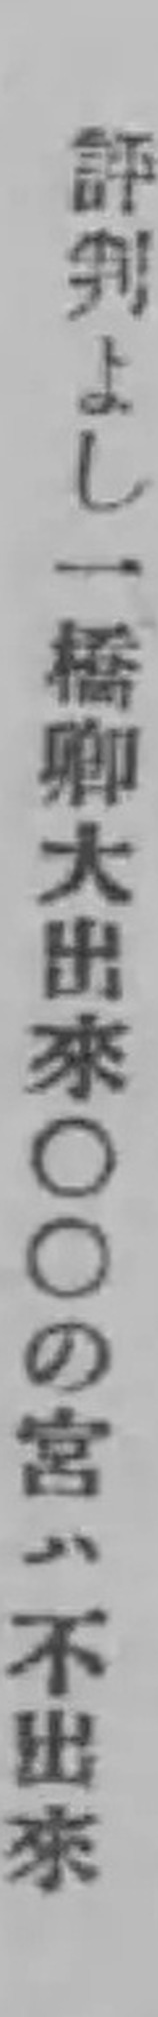評判よし一橋卿大出来○○の宮ハ不出来
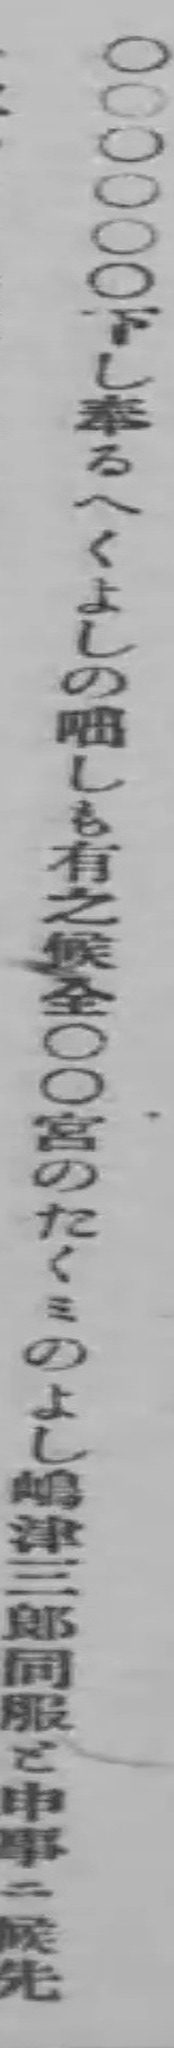○○○○○○下し奉るへくよしの咄しも有之候全○○宮のたくミのよし嶋津三郎同服と申事ニ候先
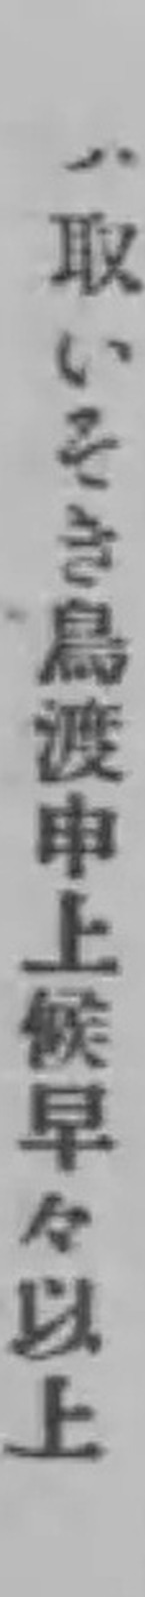ハ取いそき鳥渡申上候早々以上
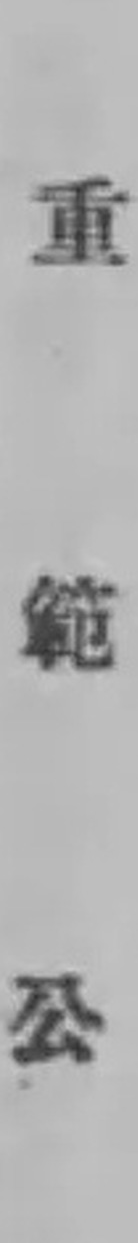重範公
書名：豊橋市史談
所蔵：国立国会図書館 National Diet Library, JAPAN
